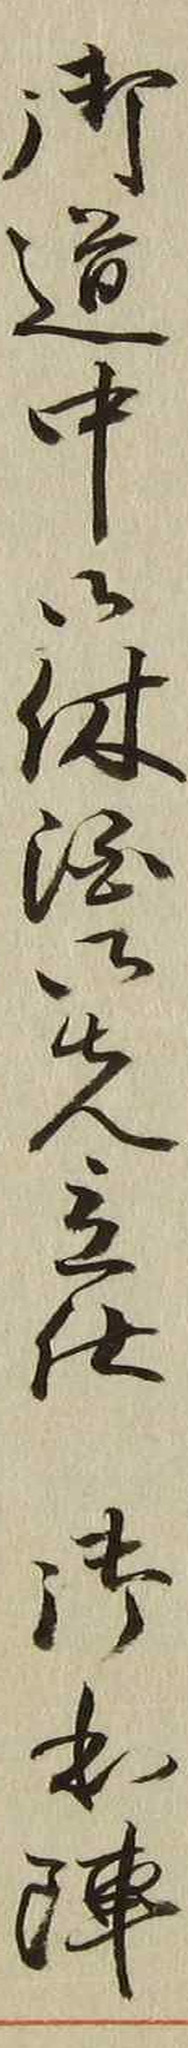御道中御休泊御先立仕御本陣
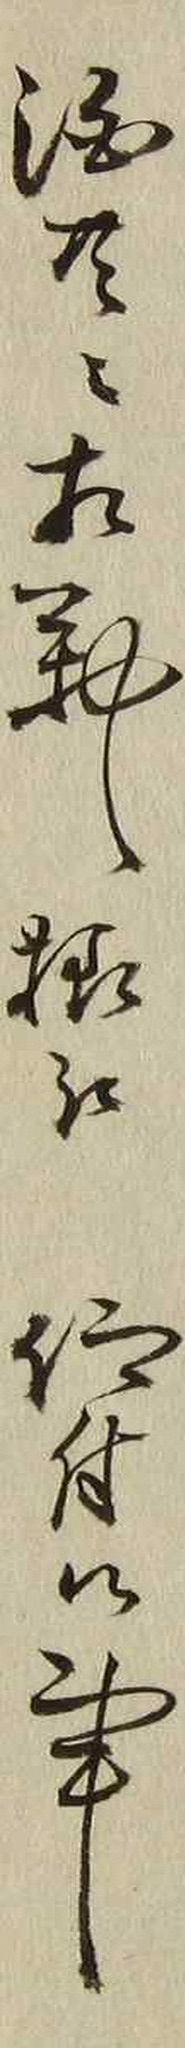泊共ニ相勤候様被仰付候事
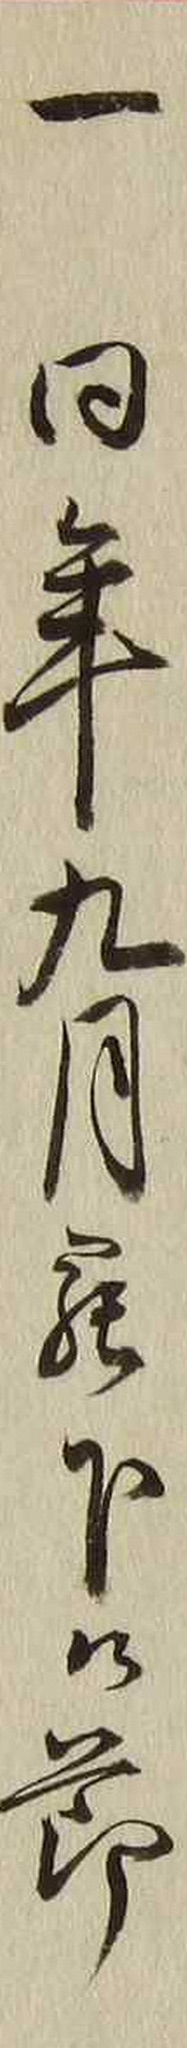一同年九月罷下候節
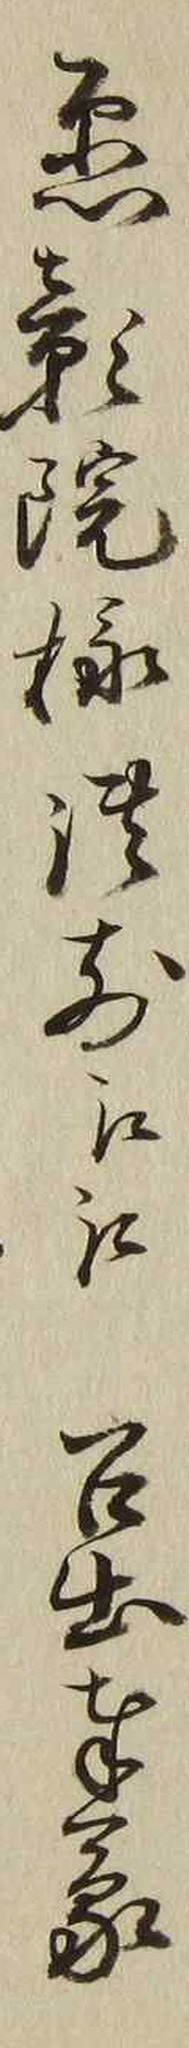愿彰院様御前江被召出奉蒙
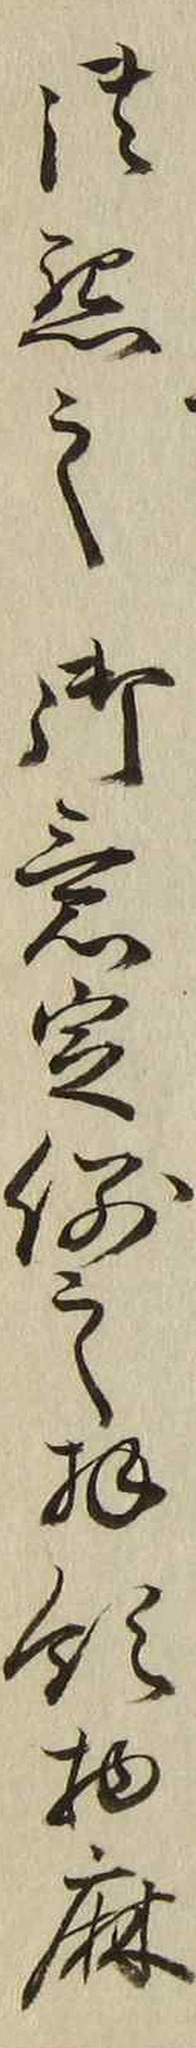御懇之御意定例之拝領物麻
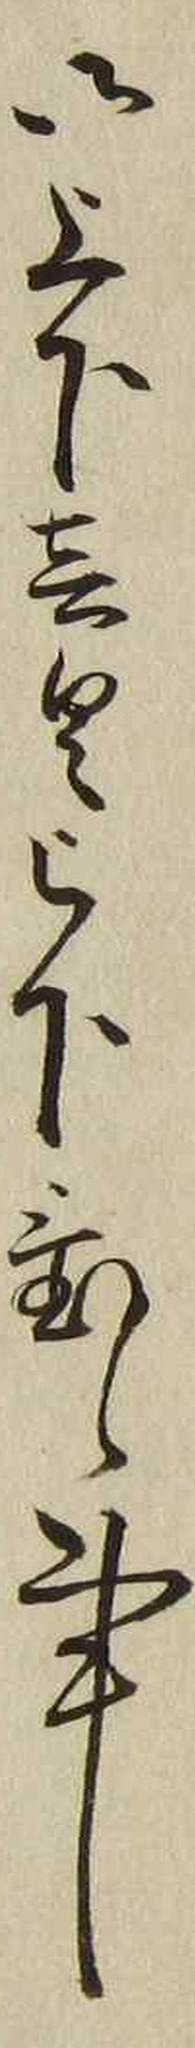御上下壱具被下置候事
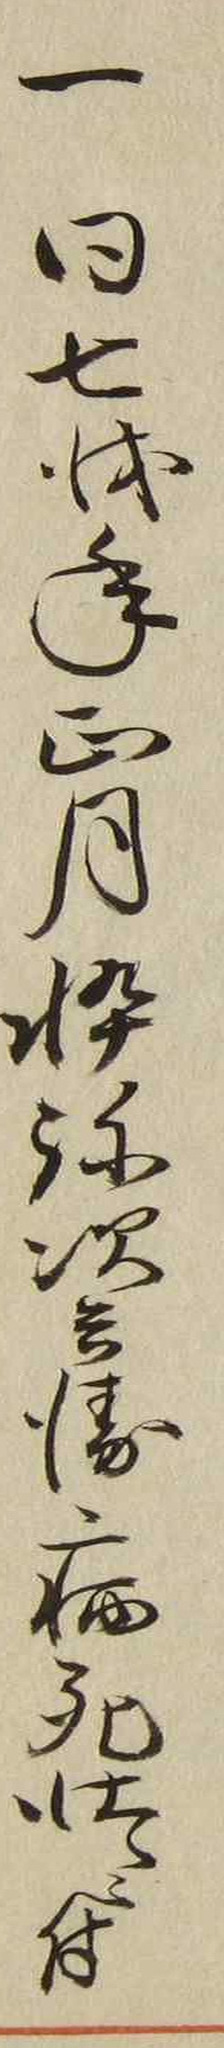一同七戌年正月忰弥次兵衛病死ニ付

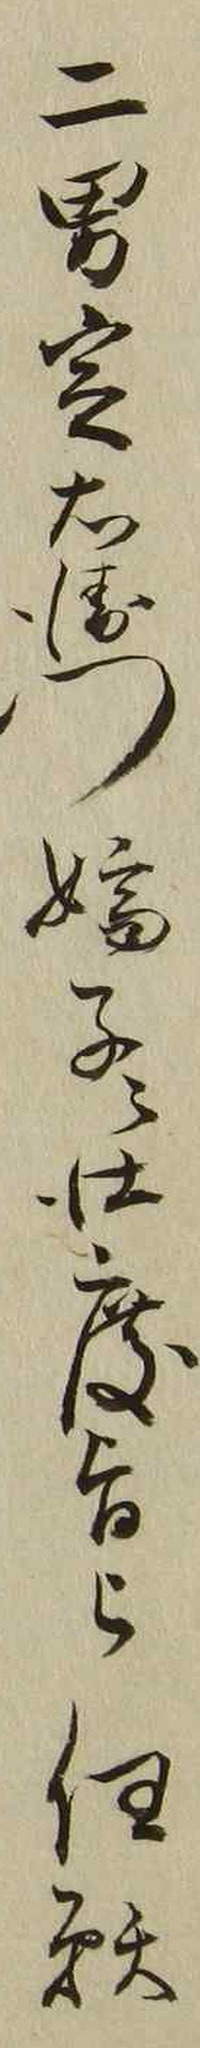二男定右衛門嫡子ニ仕度旨被任願
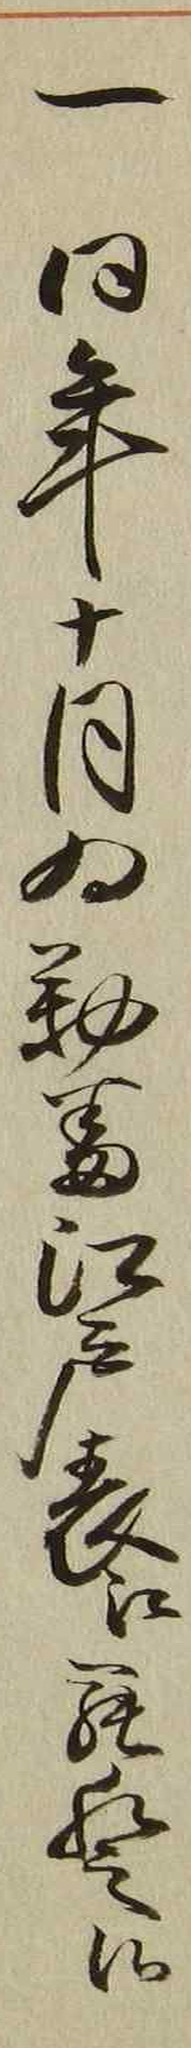一同年十月為勤番江戸表江罷登候
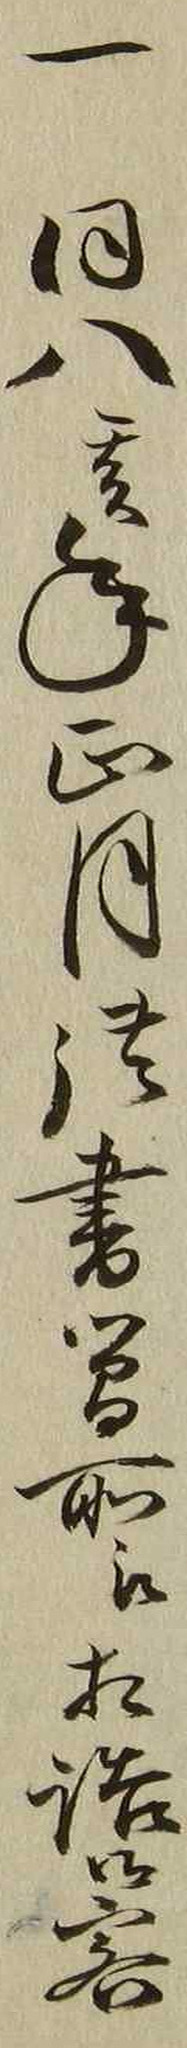一同八亥年正月御書簡所江相詰御客
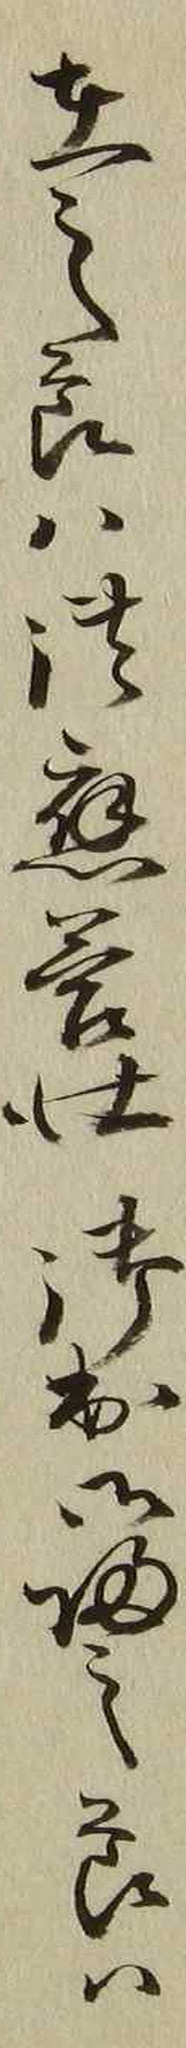在之節ハ御応答仕御出御帰之節ハ
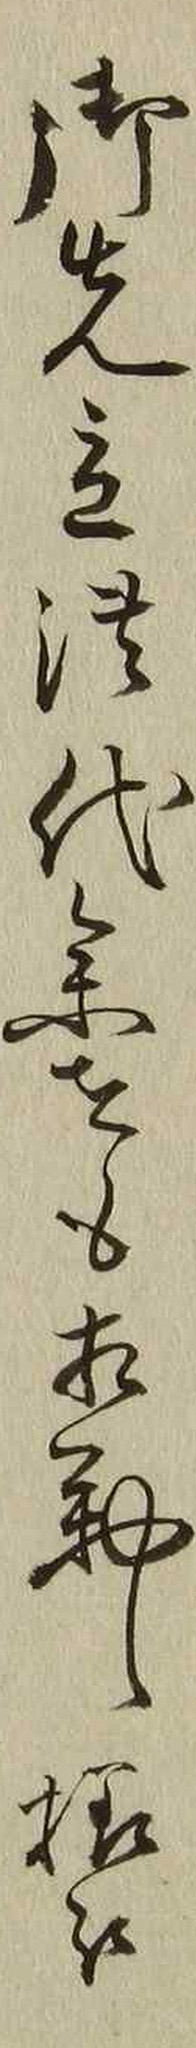御先立御代参をも相勤候様被
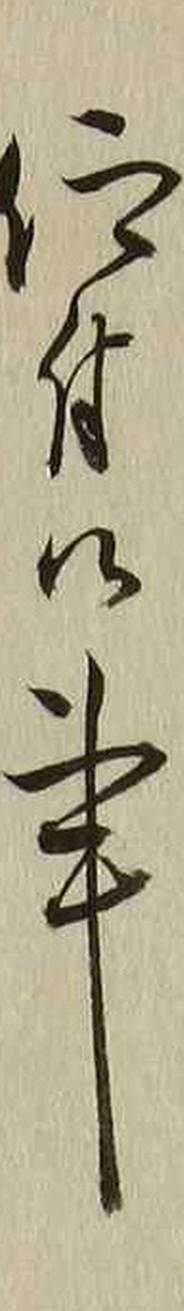仰付候事
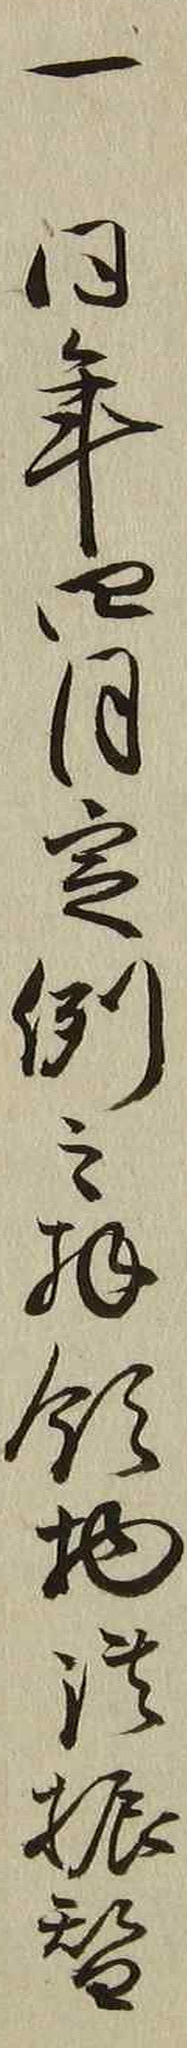一同年四月定例之拝領物御振替
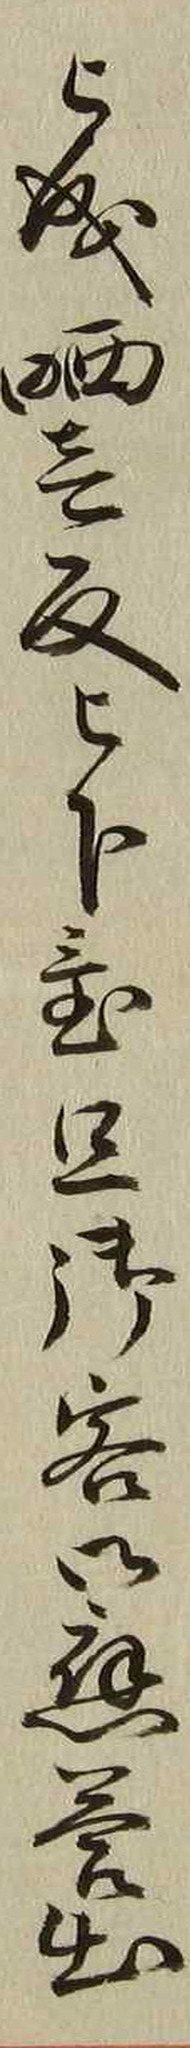被成晒壱反被下置且御客御応答出
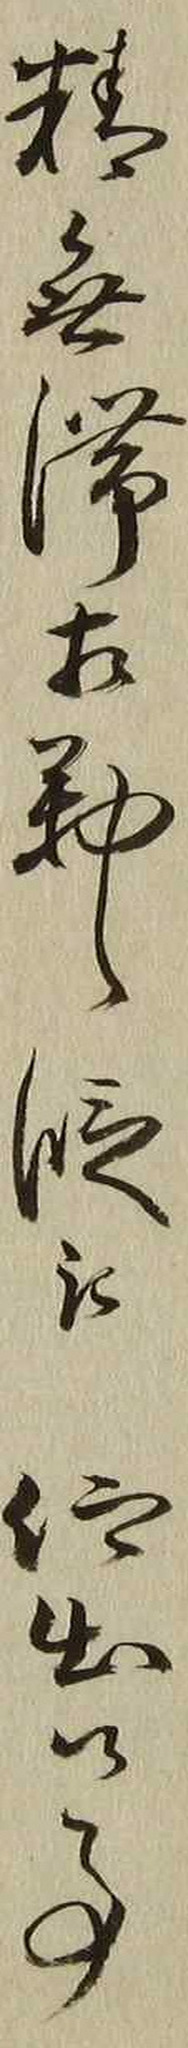精無滞相勤候段被仰出候事
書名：諸士系譜　巻之60　と之部3
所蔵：会津若松市立会津図書館
